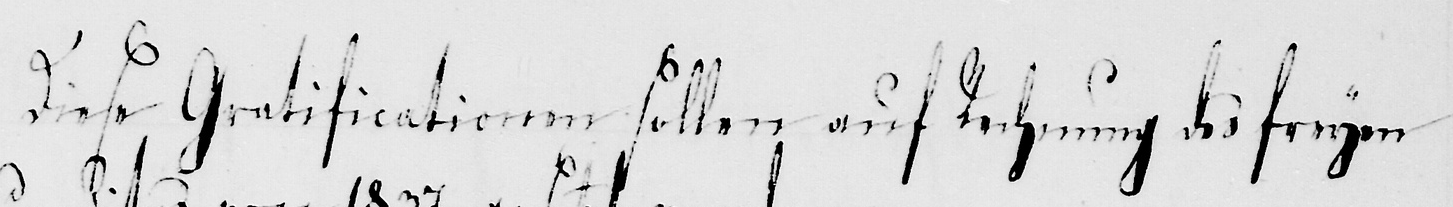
Diese Gratificationen sollen auf Rechnung des freyen
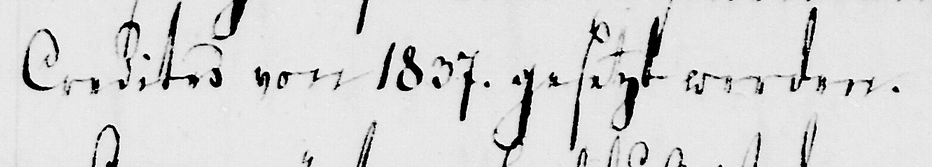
Credits von 1837. gesetzt werden.
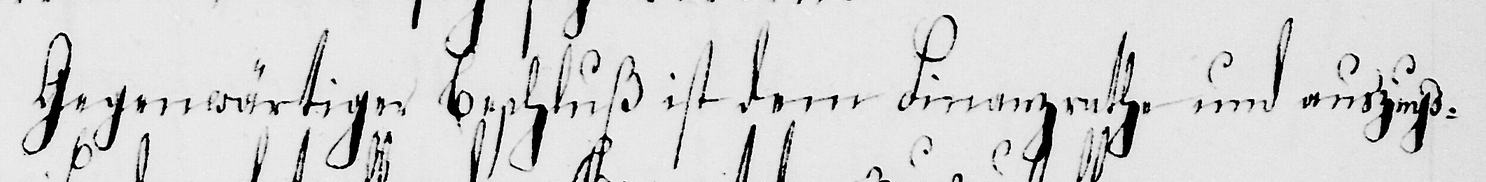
Gegenwärtiger Beschluß ist dem Finanzrathe und auszugs¬
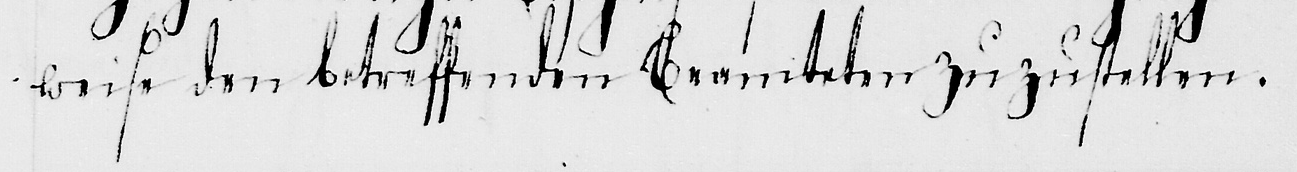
weise den betreffenden Beamteten zuzustellen.
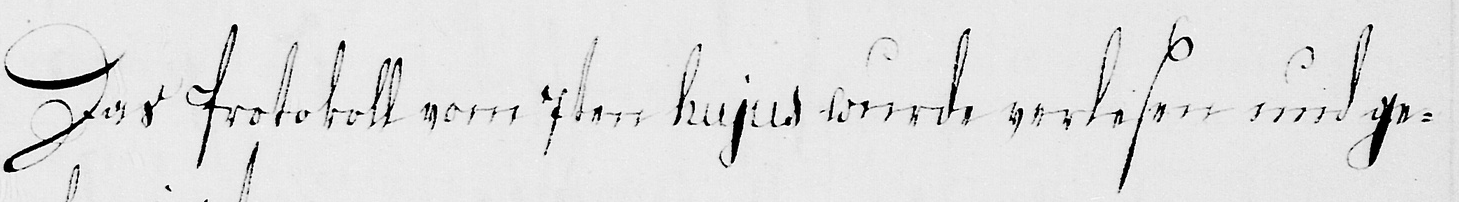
Das Protokoll vom7ten hujus wurde verlesen und ge¬
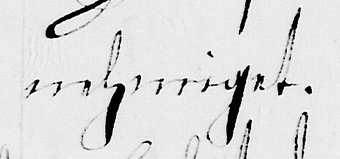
nehmiget.
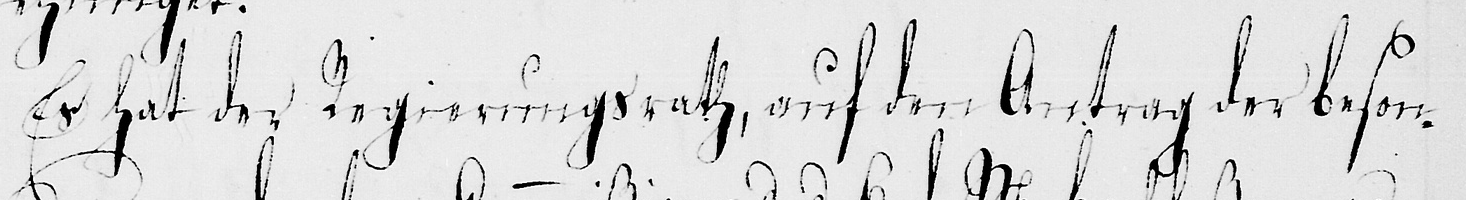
Es hat der Regierungsrath, auf den Antrag der beson¬
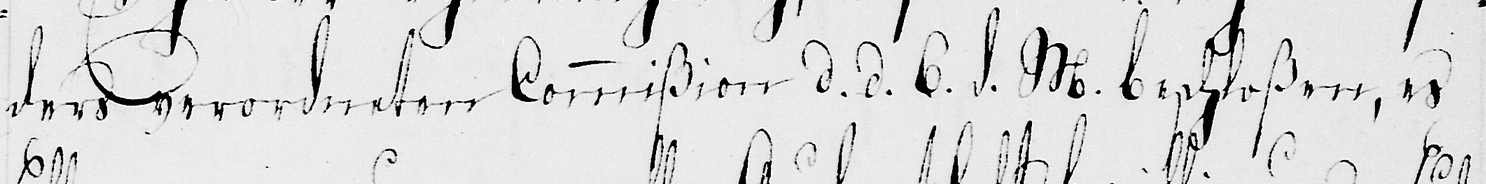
ders verordneten Commißion d. d. 6. d. M. beschloßen, es
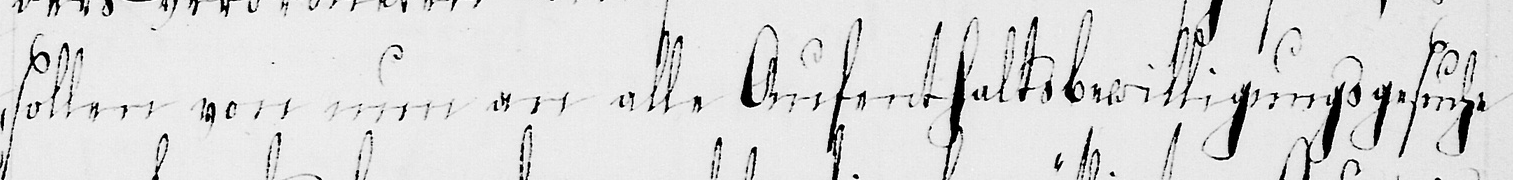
sollen von nun an alle Aufenthaltsbewilligungsgesuche
